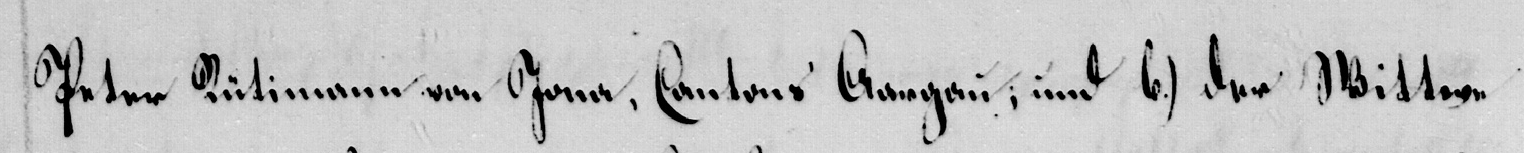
Peter Rütimann von Jona, Cantons Aargau; und b.) der Wittwe
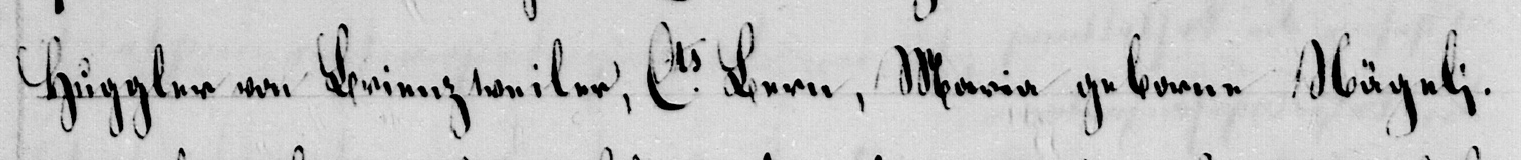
Huggler von Brienzweiler, Cts. Bern, Maria geborne Nägeli.
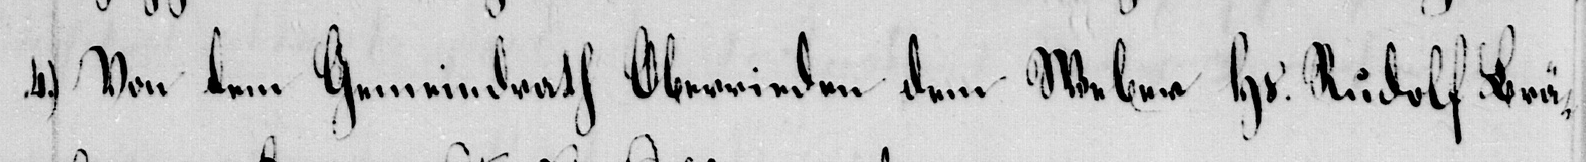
4.) Von dem Gemeindrath Oberrieden dem Weber Hs. Rudolf Bräc¬
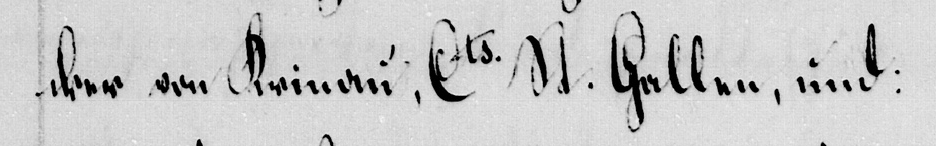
ker von Krinau, Cts. St. Gallen, und:
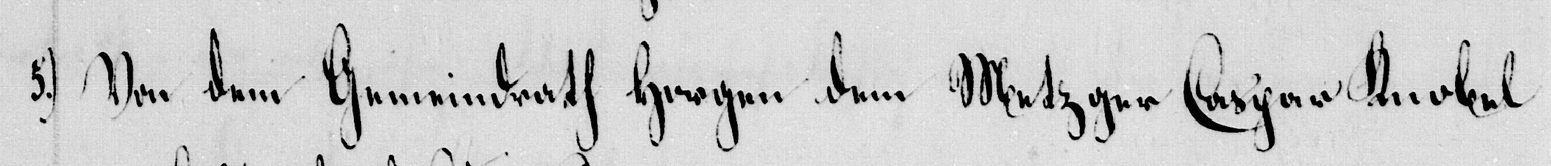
5.) Von dem Gemeindrath Horgen dem Metzger Caspar Knobel
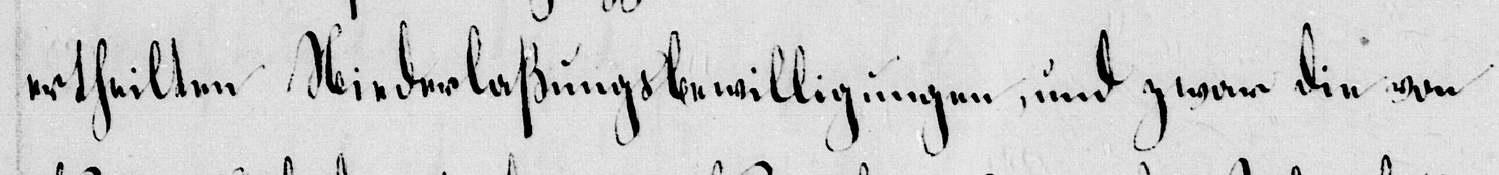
ertheilten Niederlaßungsbewilligungen und zwar die von
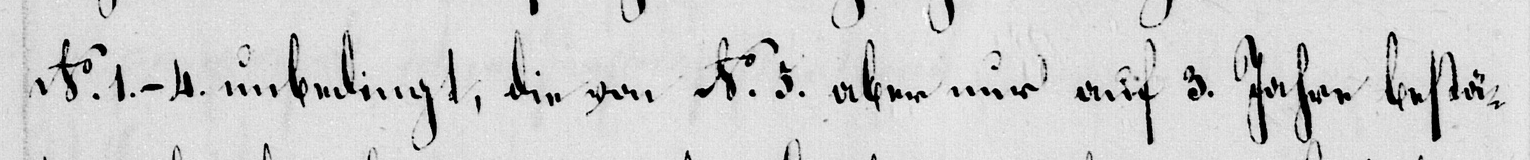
No. 1–4. unbedingt, die von No. 5. aber nur auf 4. Jahre bestä¬
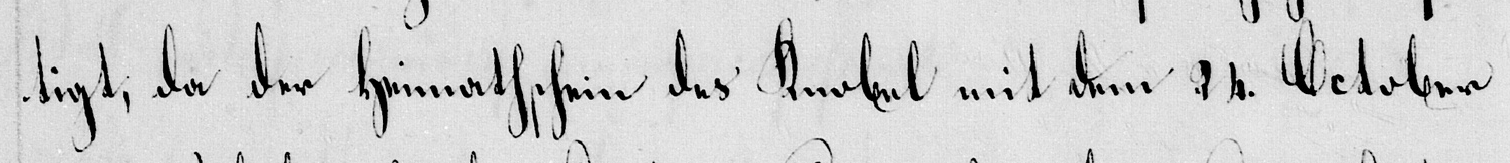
tigt, da der Heimathschein des Knobel mit dem 24. October
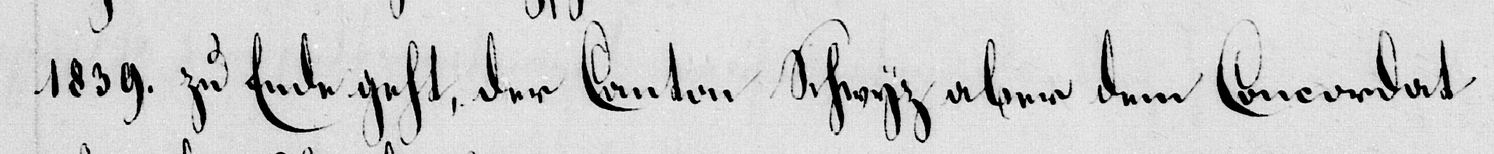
1839. zu Ende geht, der Canton Schwyz aber dem Concordat
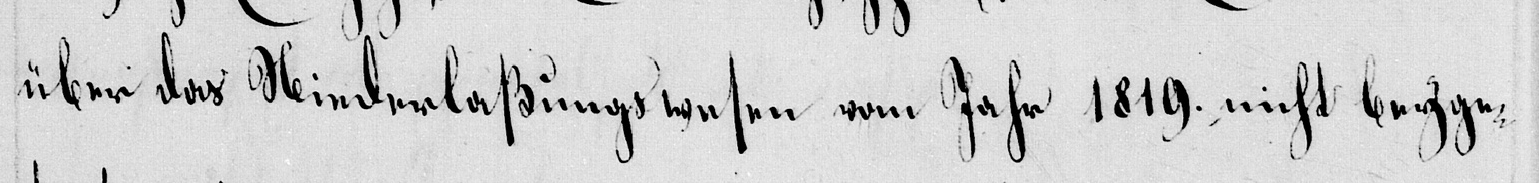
über das Niederlaßungswesen vom Jahr 1819. nicht beyge¬
